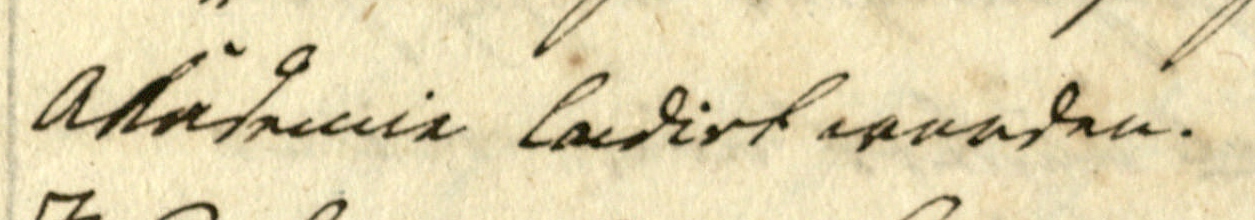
Akademie laedirt worden.
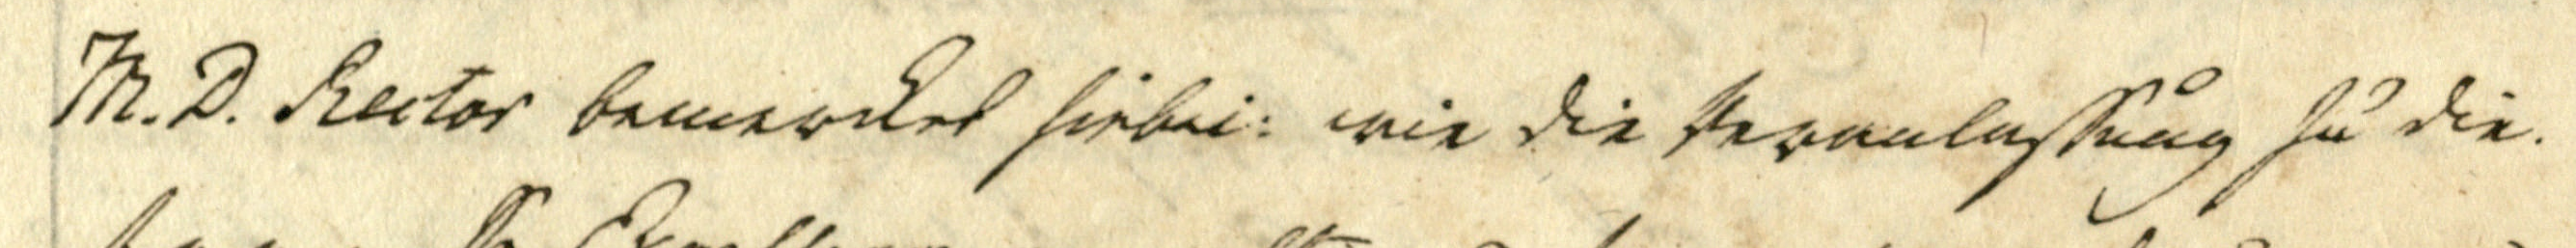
M. D. Rector bemercket hiebei: wie die Veranlassung zu die¬
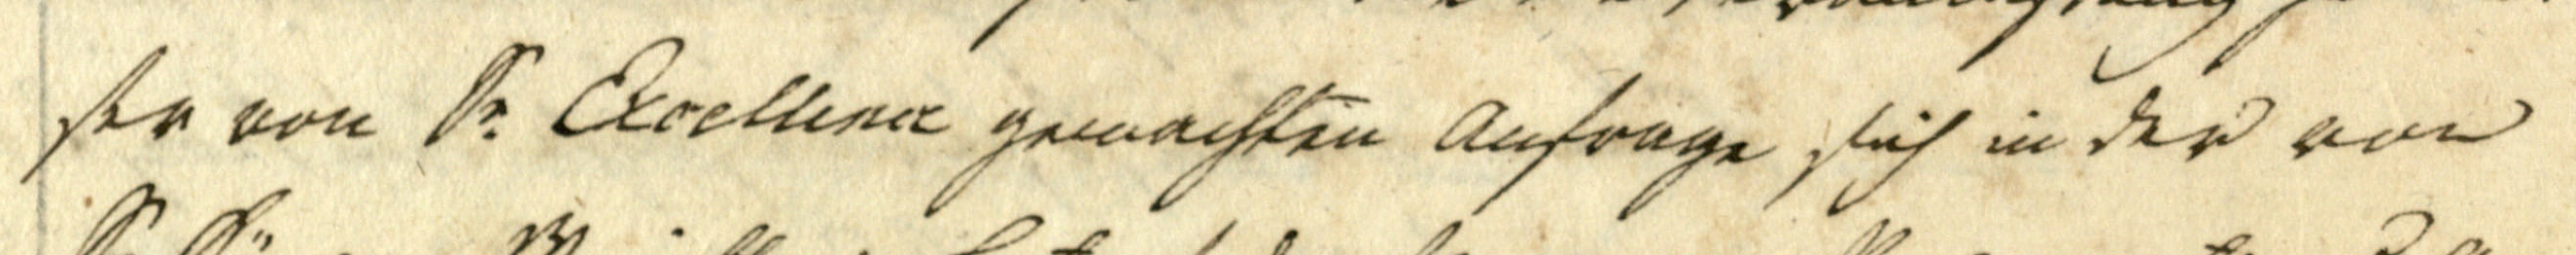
ser von Sr Excellence gemachten Anfrage sich in der von
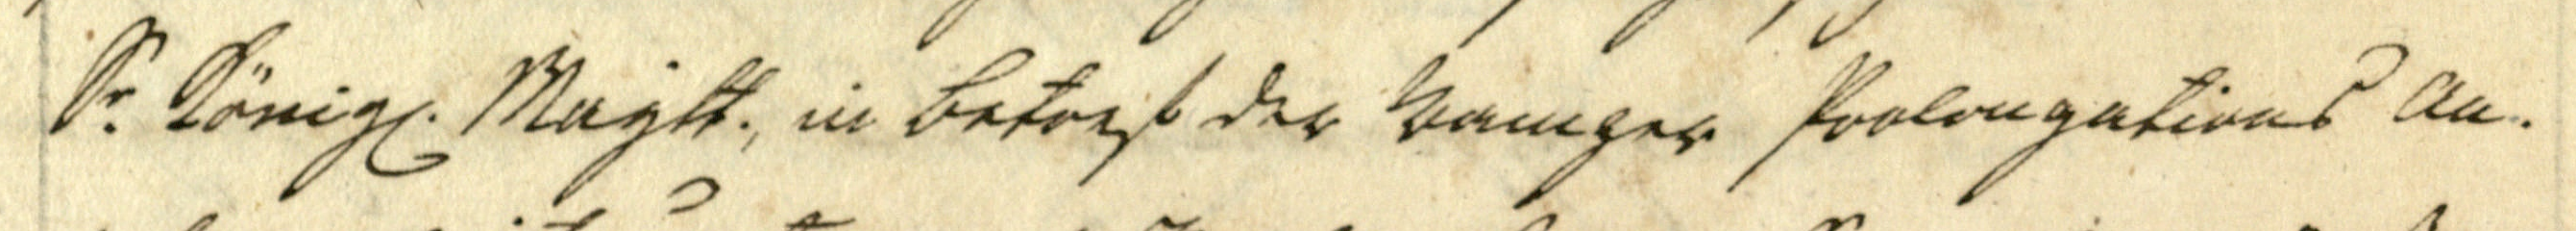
Sr Königl. Maÿtt., in Betref der Wamper Prolongations An¬
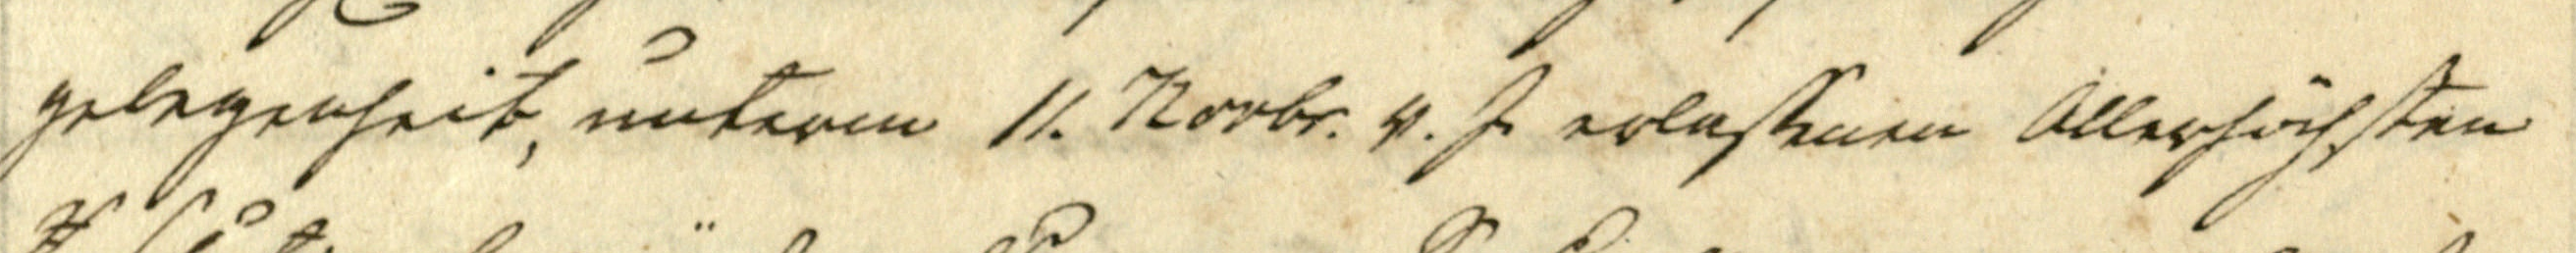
gelegenheit, unterm 11. Novbr. v. J. erlassenen Allerhöchsten
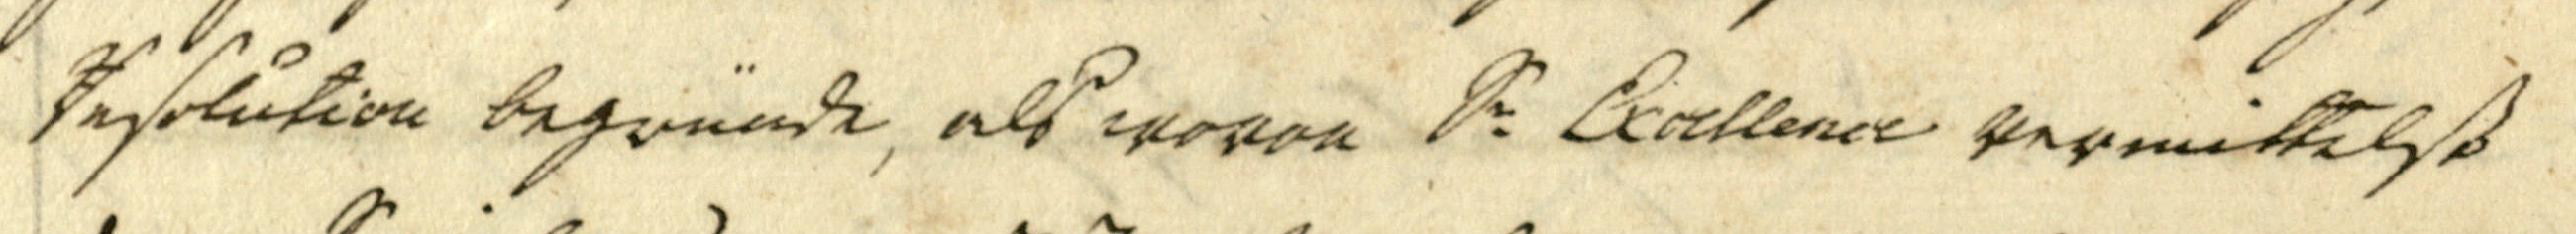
Resolution begründe, als wovon Sr Excellence vermittelst
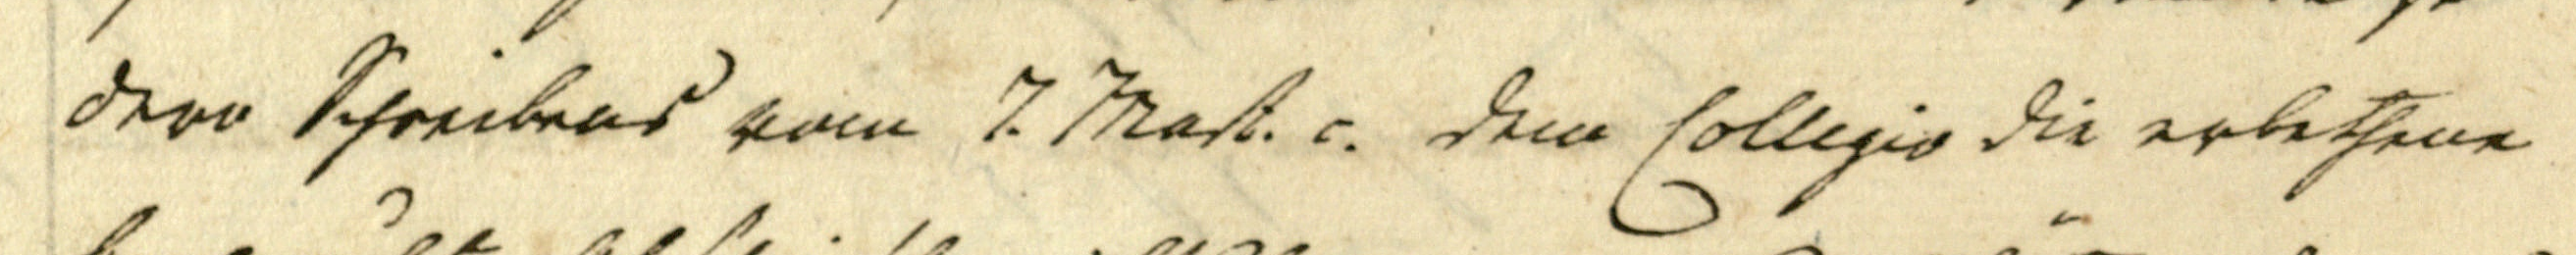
dero Schreibens vom /. Mart. c. dem Collegio die erbethene
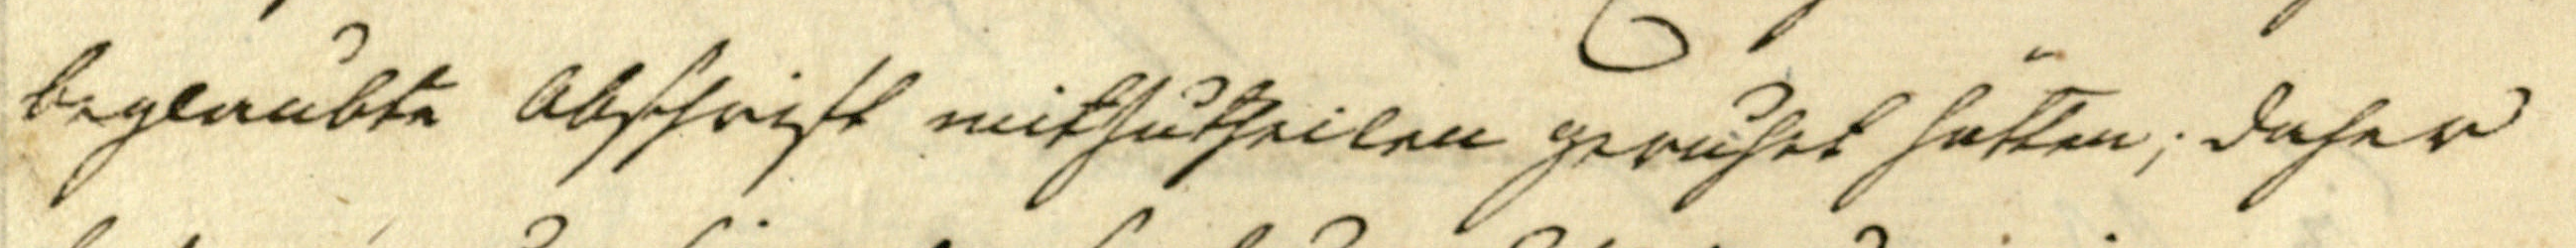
beglaubte Abschrift mitzutheilen geruhet hätten, daher
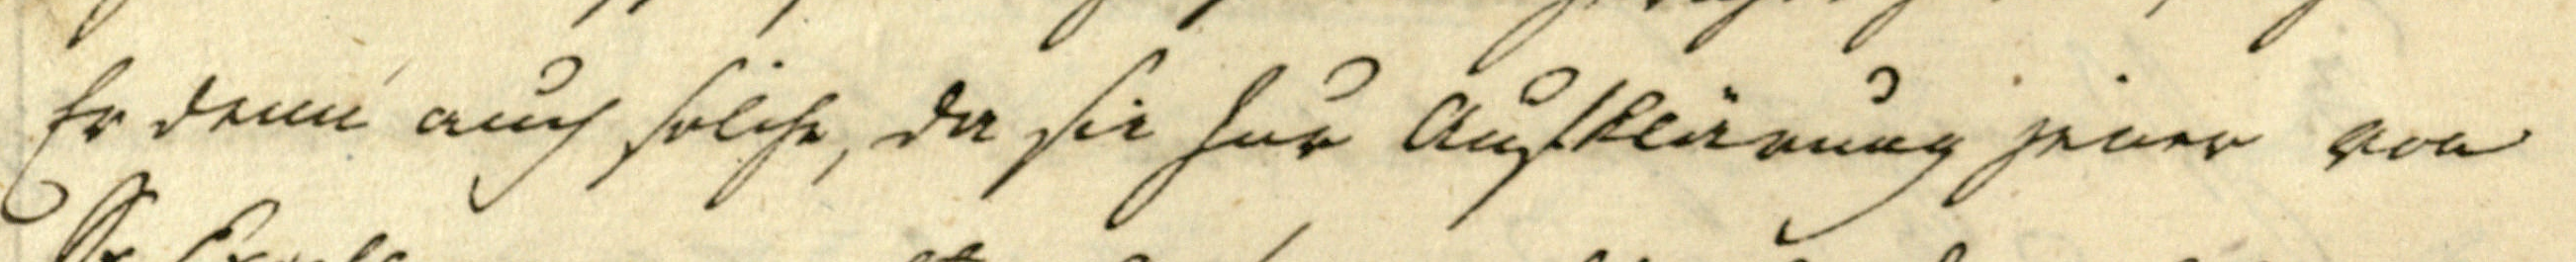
Er denn auch solche, da sie zur Aufklärung jener von
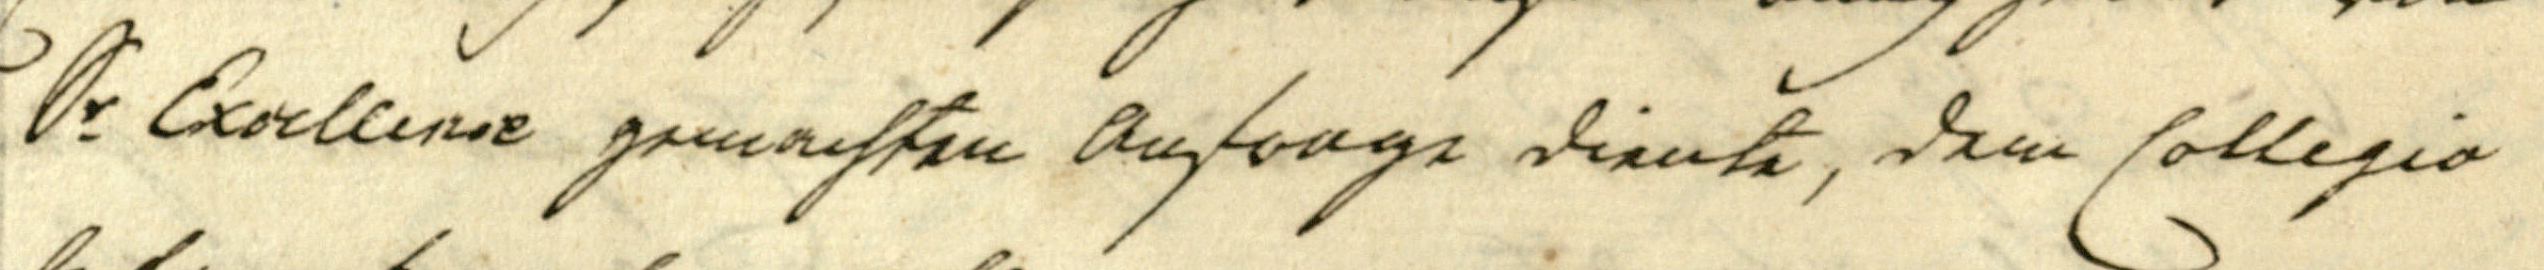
Sr Excellence gemachten Anfrage diente, dem Collegio
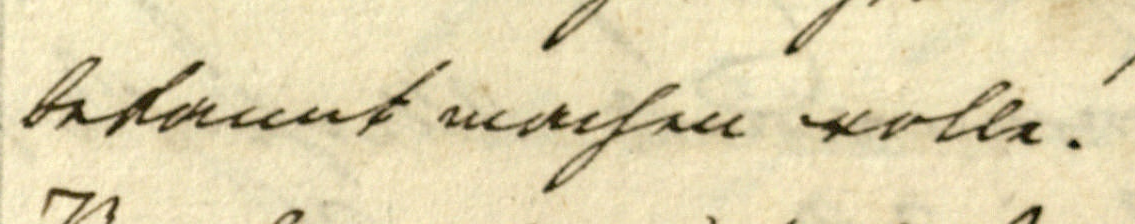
bekannt machen wolle.
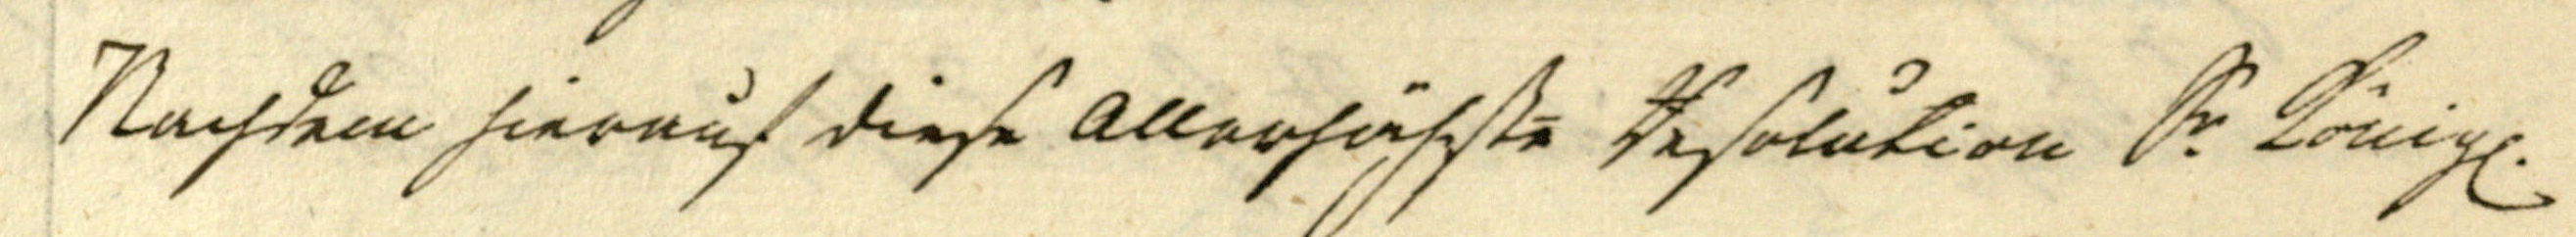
Nachdem hierauf diese Allerhöchste Resolution Sr Königl.
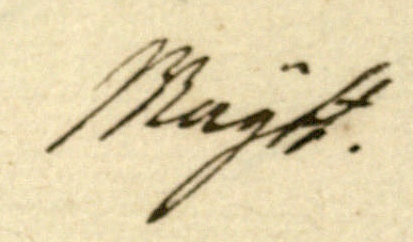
Maÿtt.
